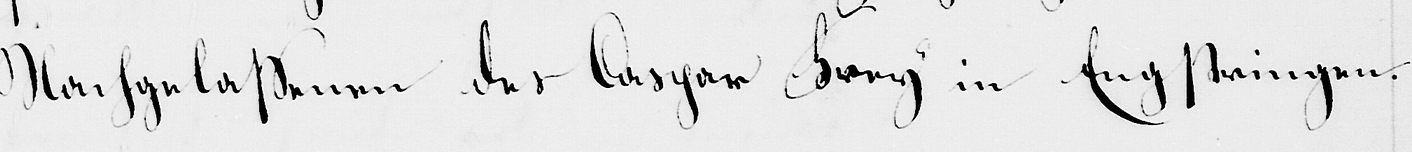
Nachgelaßenen des Caspar Frey in Engstringen.
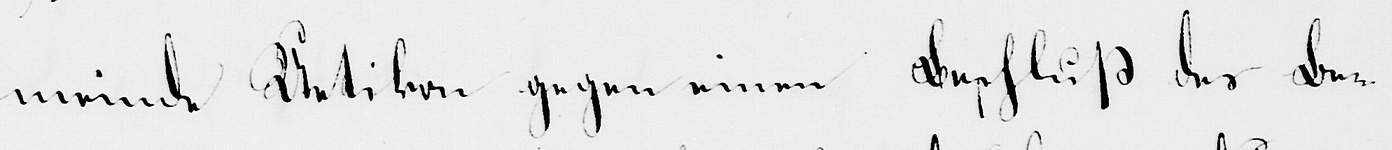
meinde Uetikon gegen einen Beschluß des Be¬
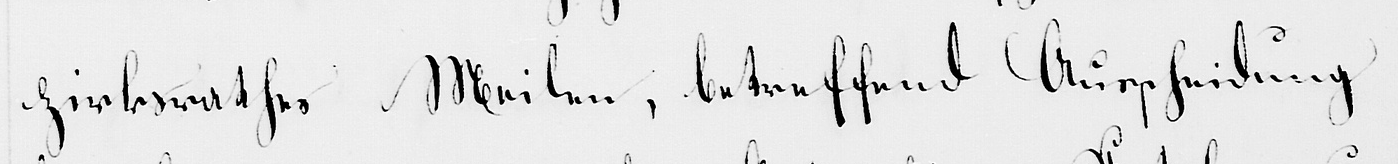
zirksrathes Meilen, betreffend Ausscheidung
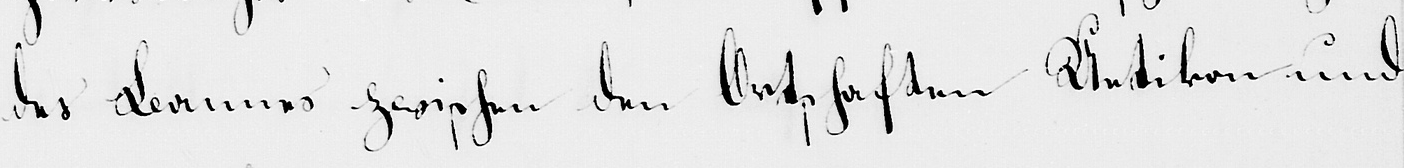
des Bannes zwischen den Ortschaften Uetikon und
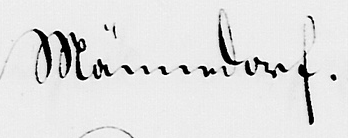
Männedorf.
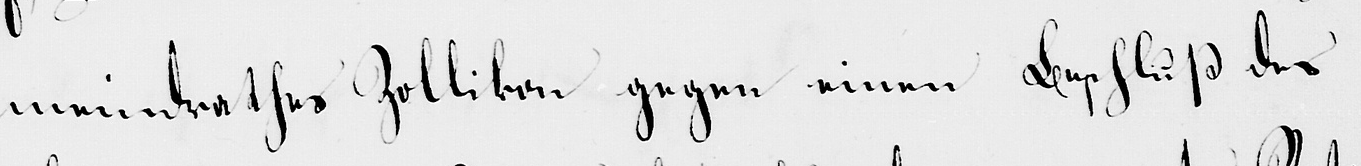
meindrathes Zollikon gegen einen Beschluß des
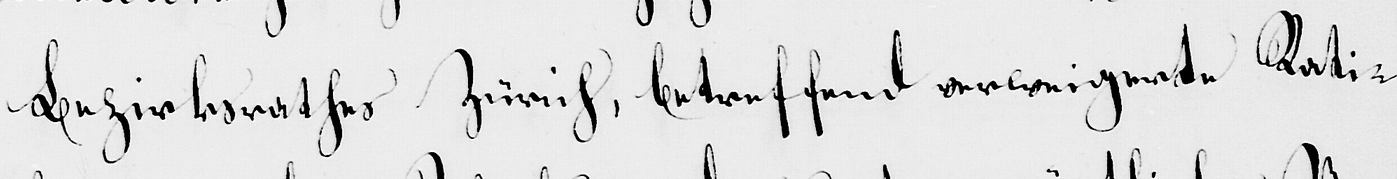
Bezirksrathes Zürich, betreffend verweigerte Rati¬
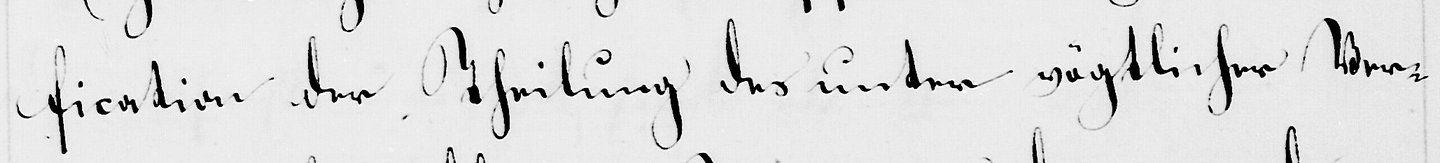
fication der Theilung des unter vögtlicher Ver¬
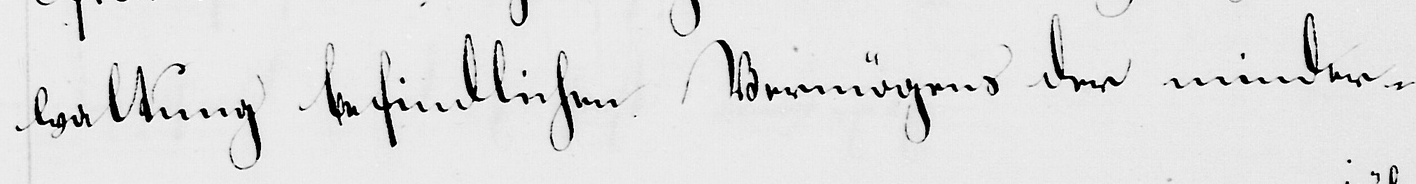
waltung befindlichen Vermögens der minder-
